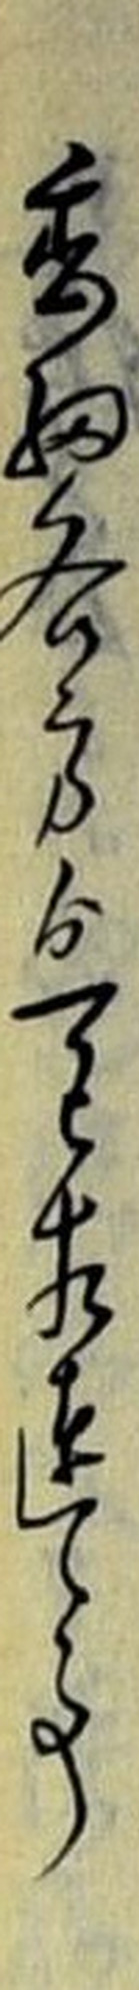委細各方ゟ可被相達候事
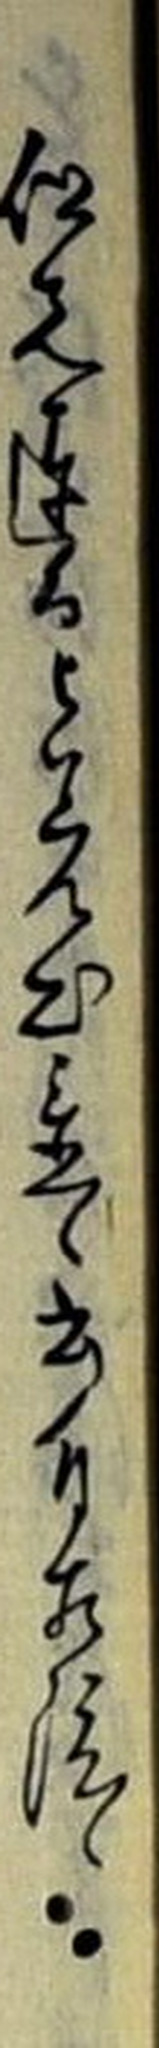但先達而被差出置候書付相渡候
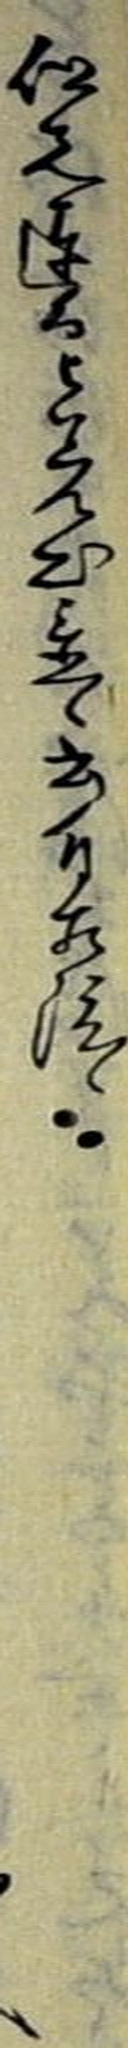但先達而被差出置候書付相渡候
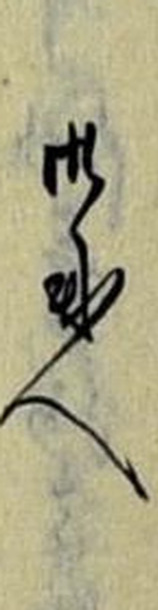御用人
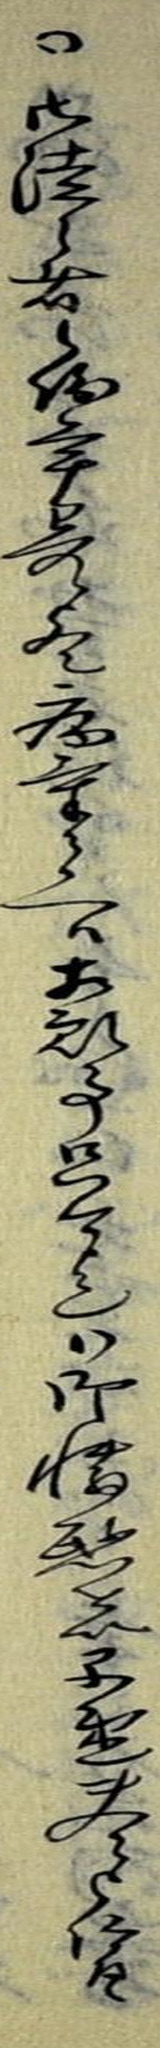〇御徒之者之儀年寄候歟病気に候へは相願事只今迄は御憐愍を以早速夫々被仰付候
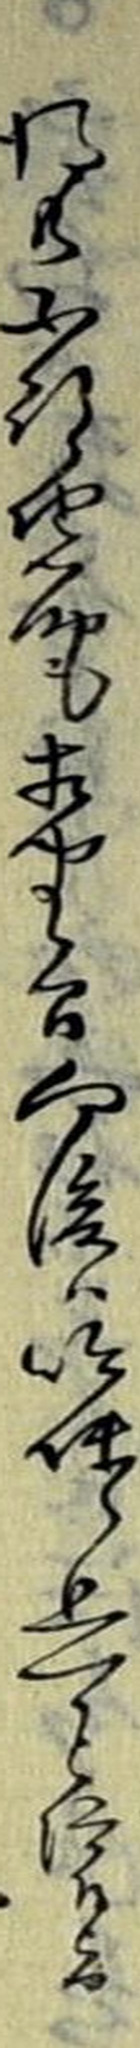得共不行届筋も相聞候間向後は吟味之上可被仰付旨
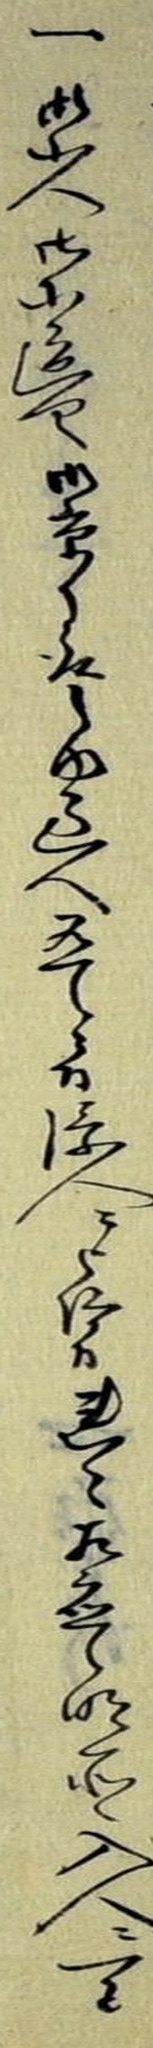一御小人御小道具御草り取之内過人有之に付浮人に被仰付連々相応之明所へ入人に可被
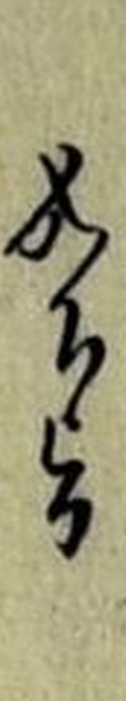成下旨
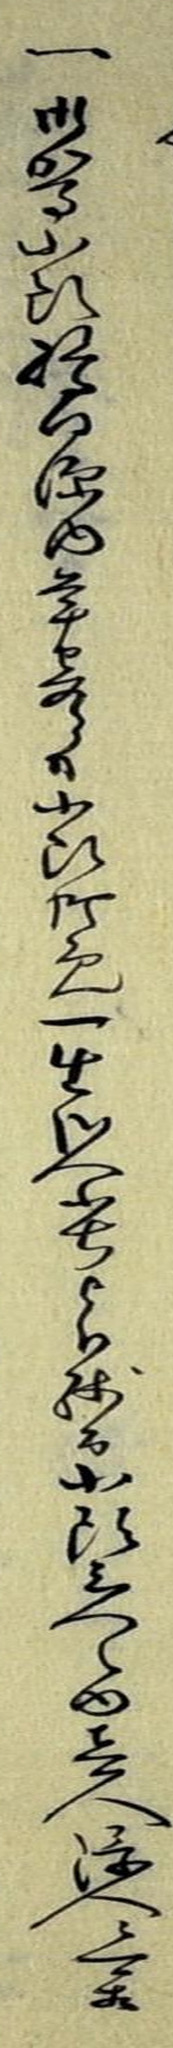一御駕小頭嶋田源内年寄に付小頭御免一生弐人ふち被下残る小頭三人之内壱人浮人に可相
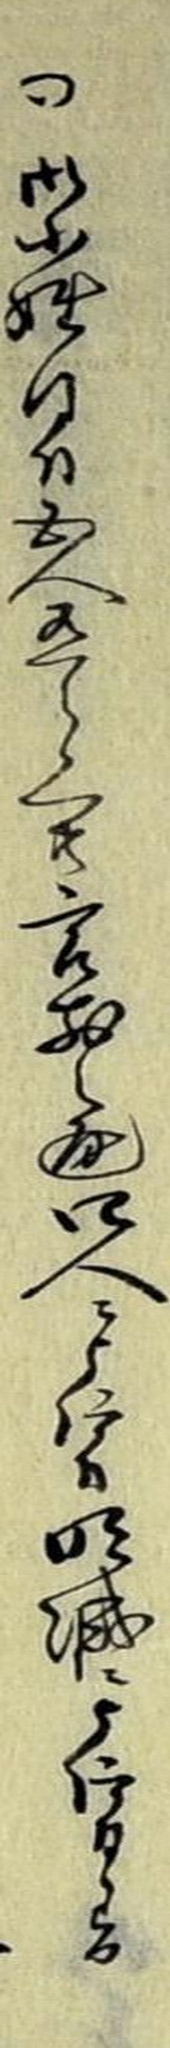〇御小姓目付五人有之候へ共最前之通四人に被仰付明減に被仰付候旨
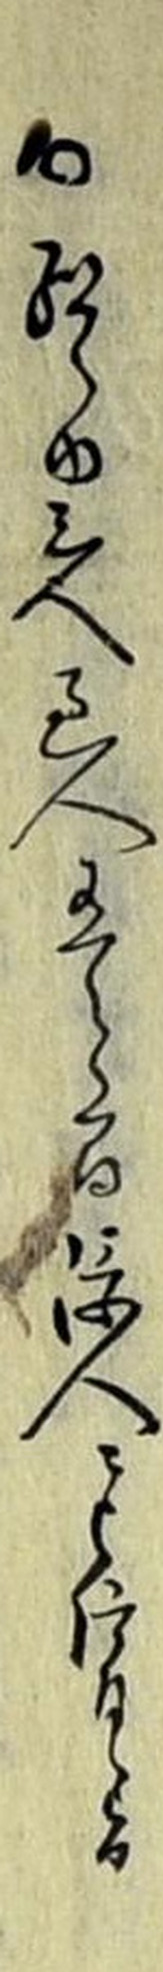〇組之内三人過人有之候間浮人に被仰付候旨
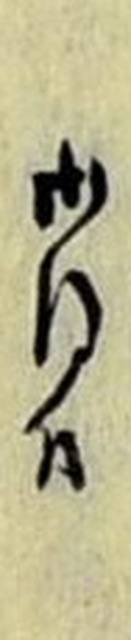御目付
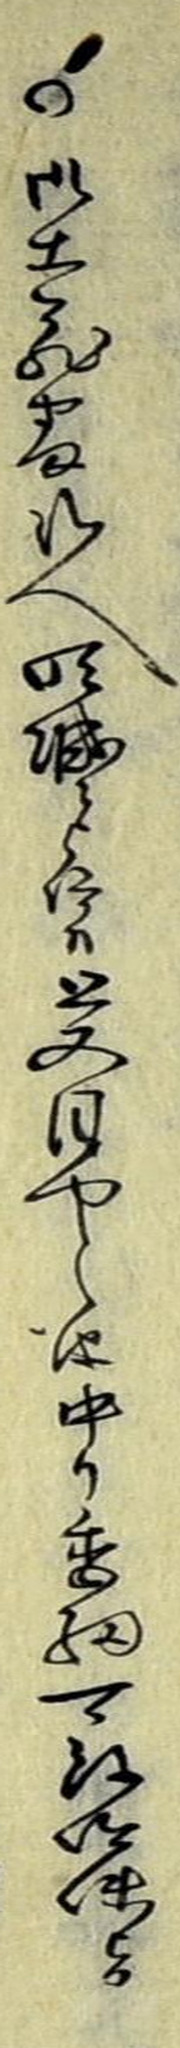〇御土蔵番弐人明減に被仰付且又目中之儀中り委細可致吟味旨
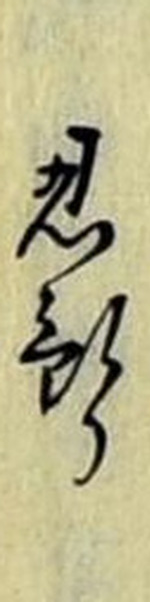忍預り
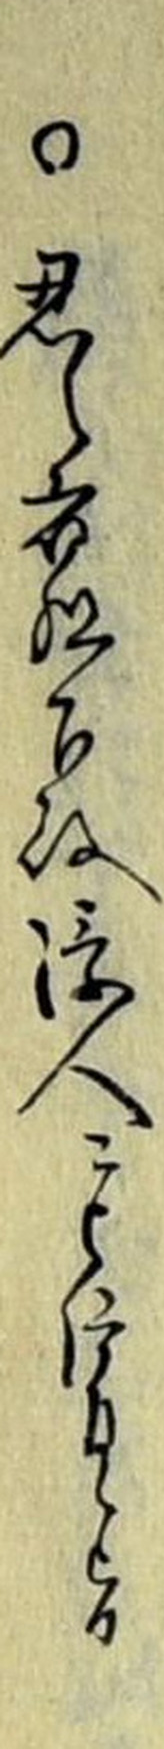〇忍之者組下役浮人に被仰付候旨

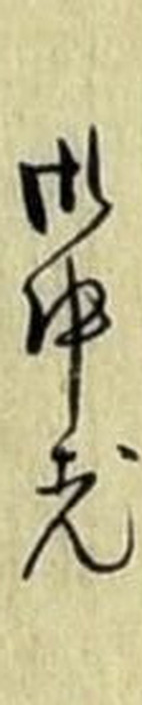御中老
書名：命令之部 二
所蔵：福井県文書館 Fukui Prefectural Archives
